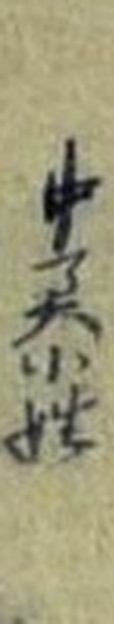中奥小姓
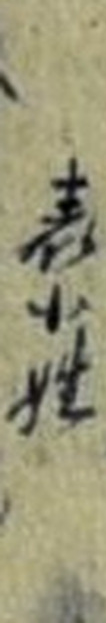表小姓
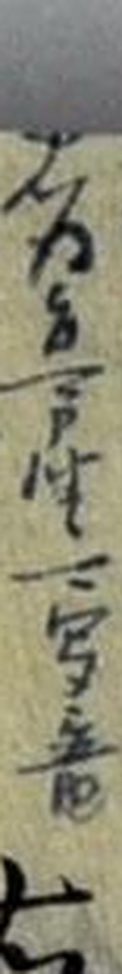心得旨可申聞候可写置由
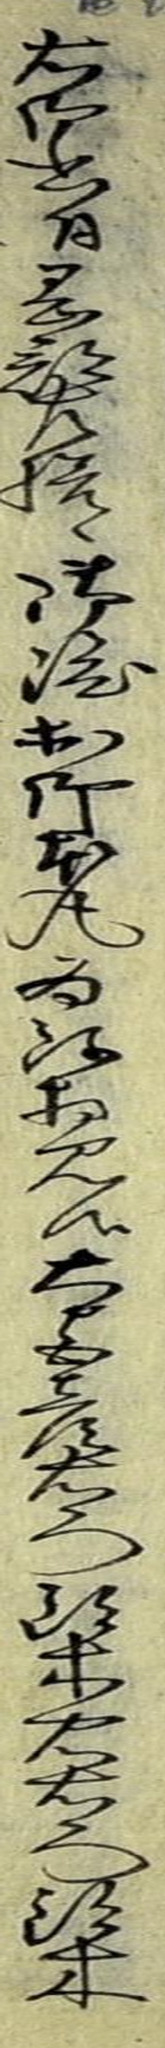右御書付岡部左膳へ御渡於御本丸為致拝見候大宮彦右衛門鈴木忠右衛門鈴木
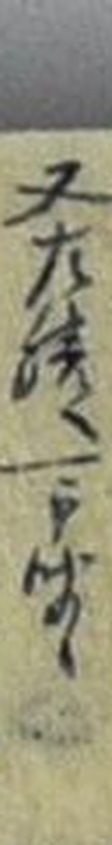又左膳へ可申聞候
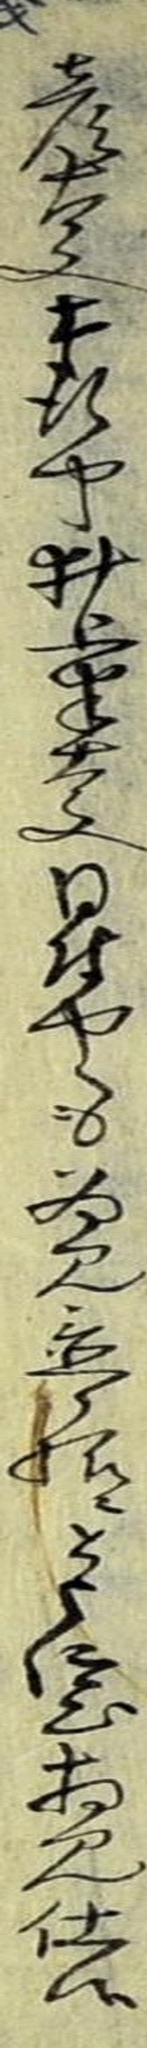彦大夫奉行中井上半大夫目付中へも為見置候様ニと被仰出拝見仕候
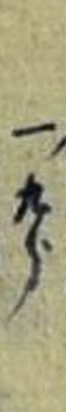一九郎
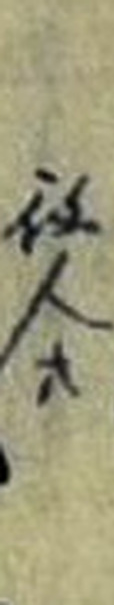役人共
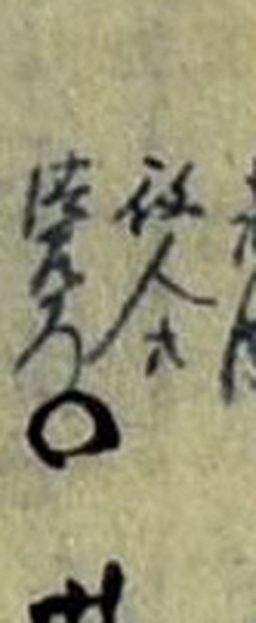清左衛門
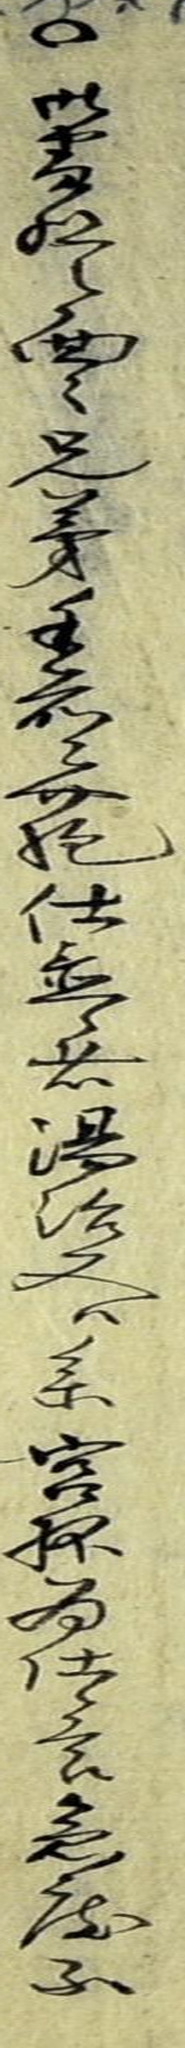〇御番組之面々兄弟手前ニ介抱仕置候者湯治又ハ参宮抔為仕候節急度不
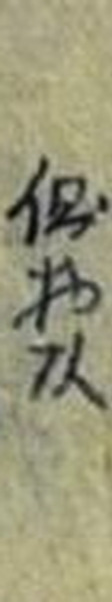側物頭
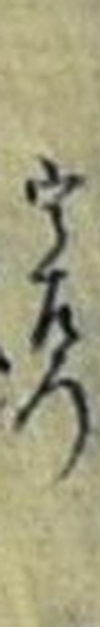宇左衛門
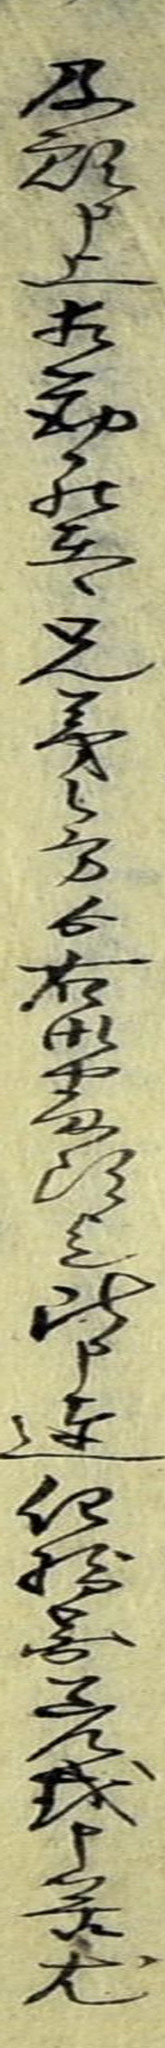及願申上相勤罷在候兄弟之方ゟ右御番頭迄断申達任指図差越申筈尤
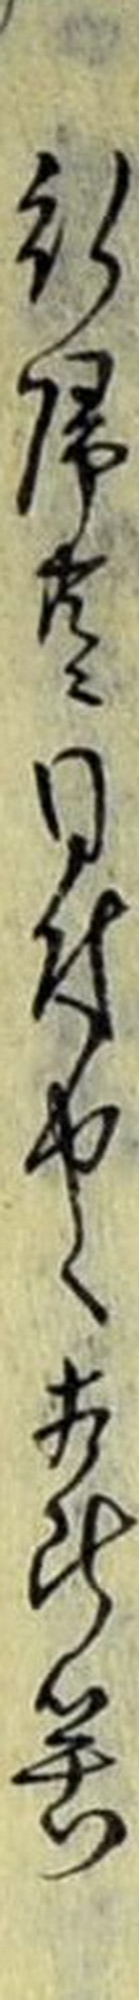行帰共ニ目付中へ相断筈
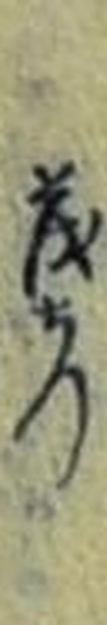茂右衛門
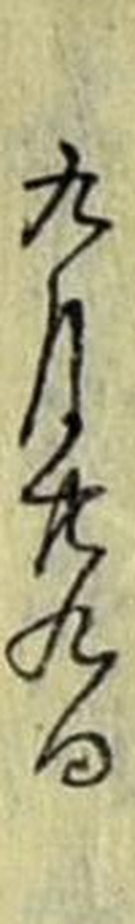九月廿九日
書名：命令之部 一
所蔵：福井県文書館 Fukui Prefectural Archives
